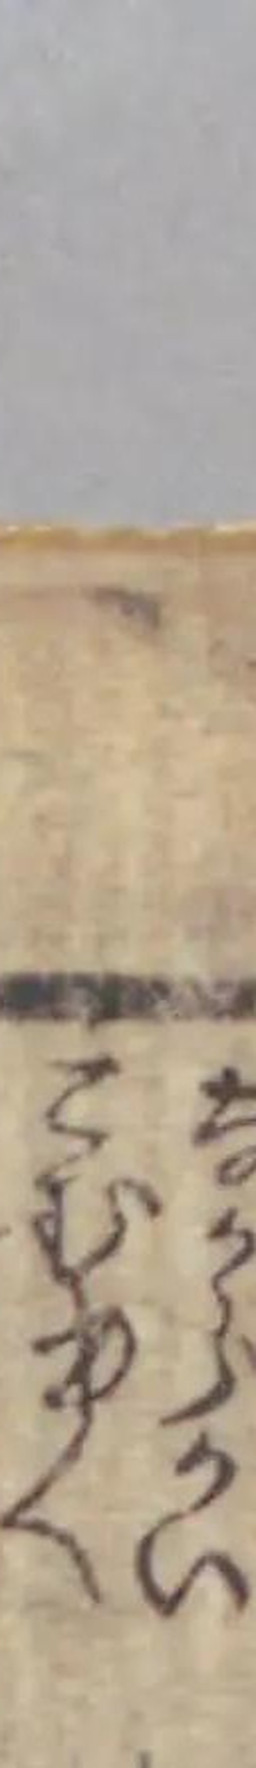こむゆへ
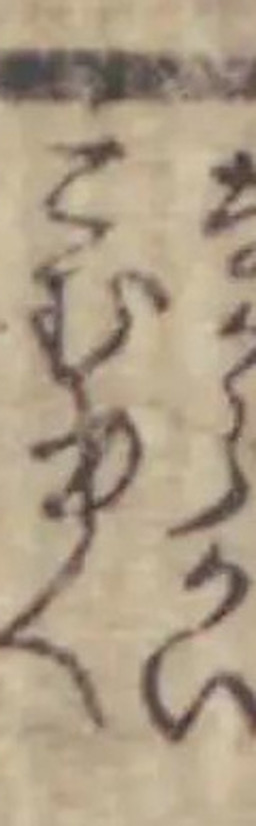こむゆへ
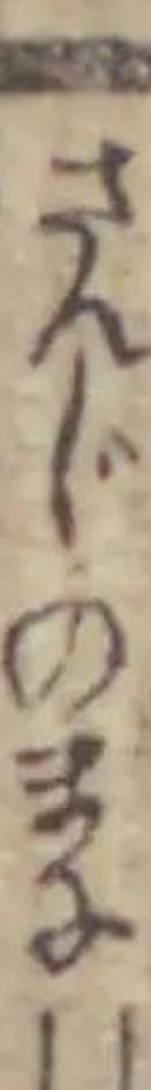さんじのまに
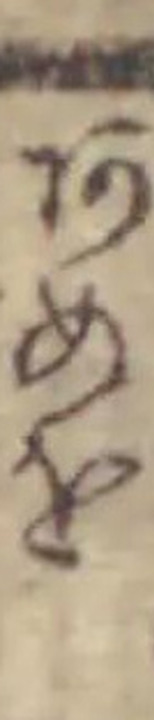あめを
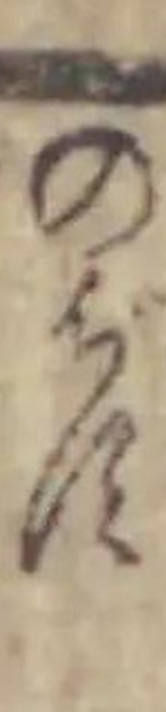のばす
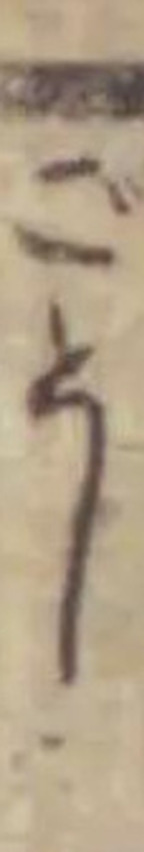ごとし
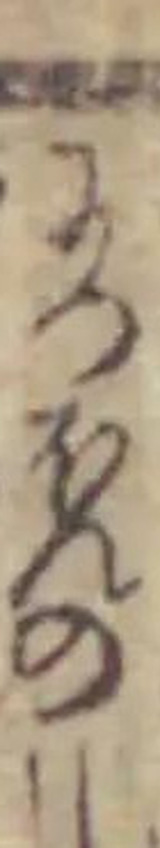につほんの
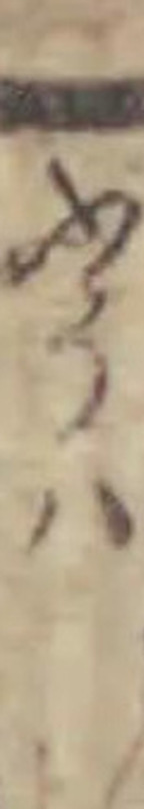ふうは
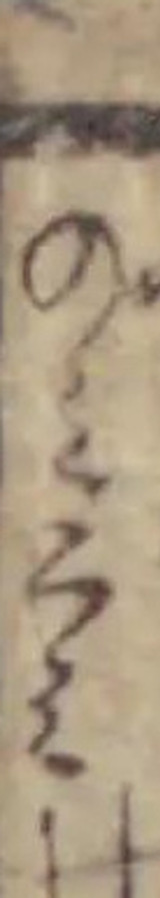のみこみ
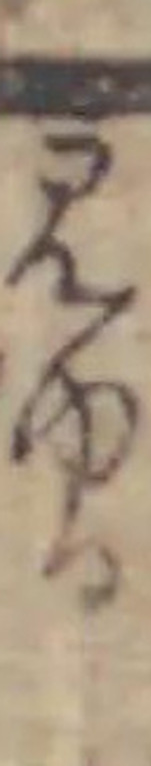見ゆる
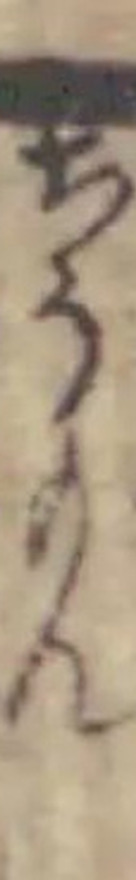ちうもん
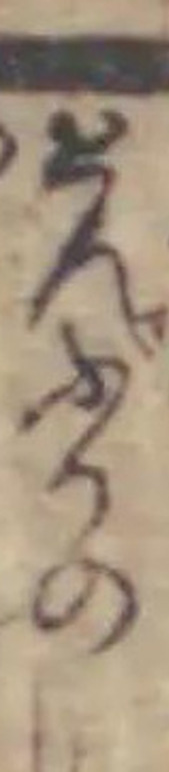とんぶりの
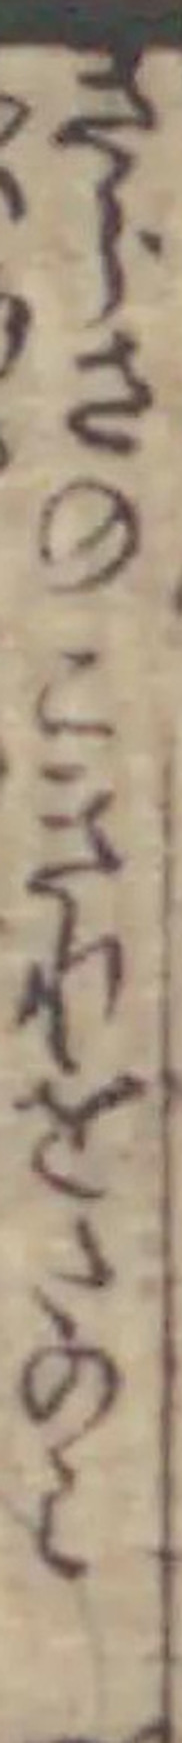さらさのこきれをたのみ
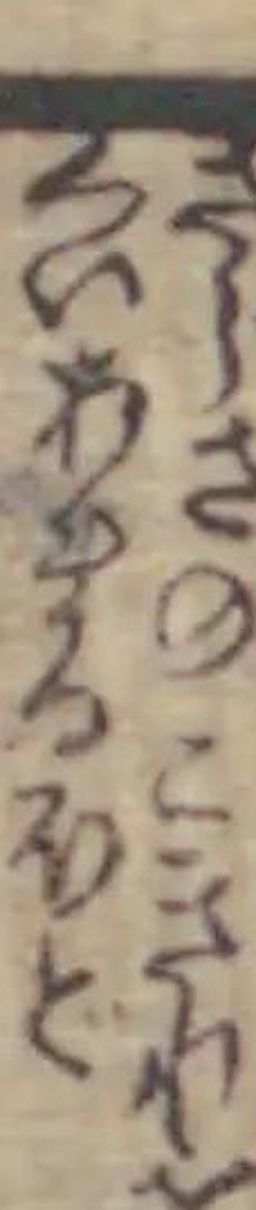くいあまるほど
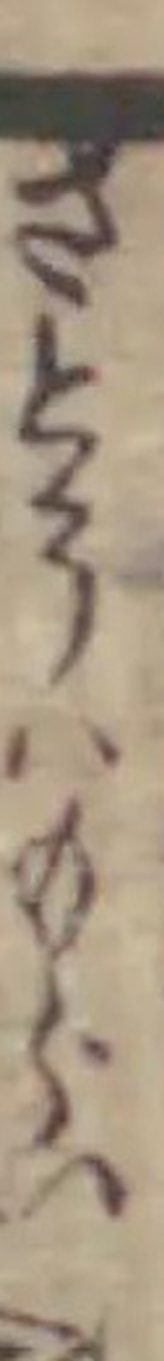さとうはもらい
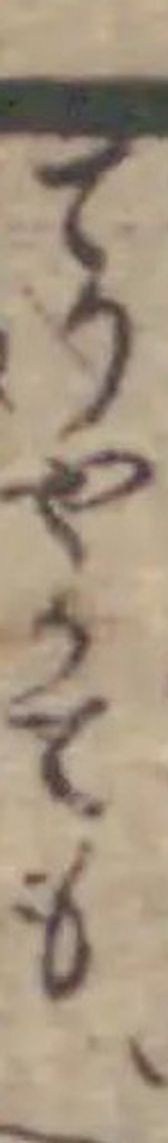てりやかても
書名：間違月夜鍋 2巻
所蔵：国立国会図書館 National Diet Library, JAPAN
